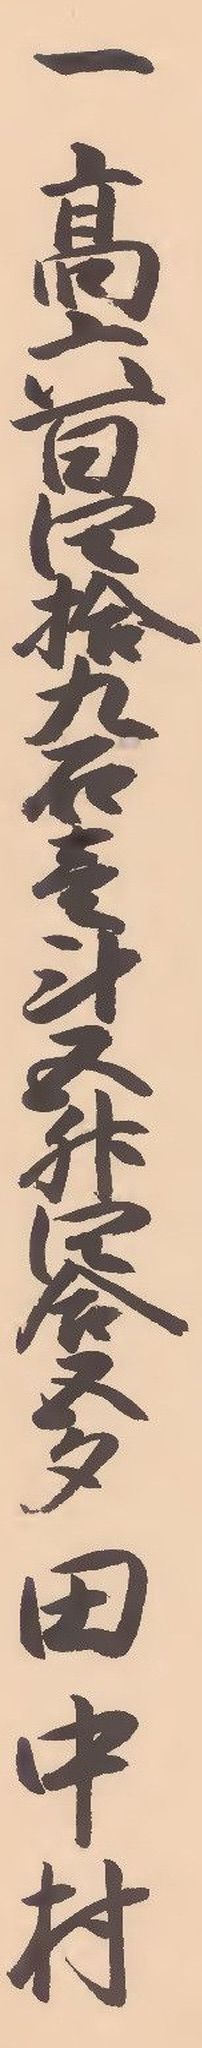一高六百四拾九石壱斗五升四合五勺田中村

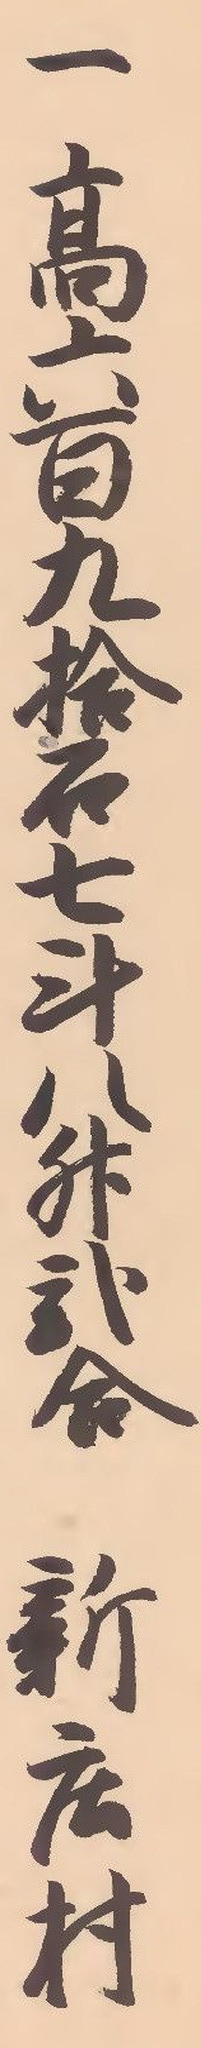一高六百九拾石七斗八升弐合新庄村
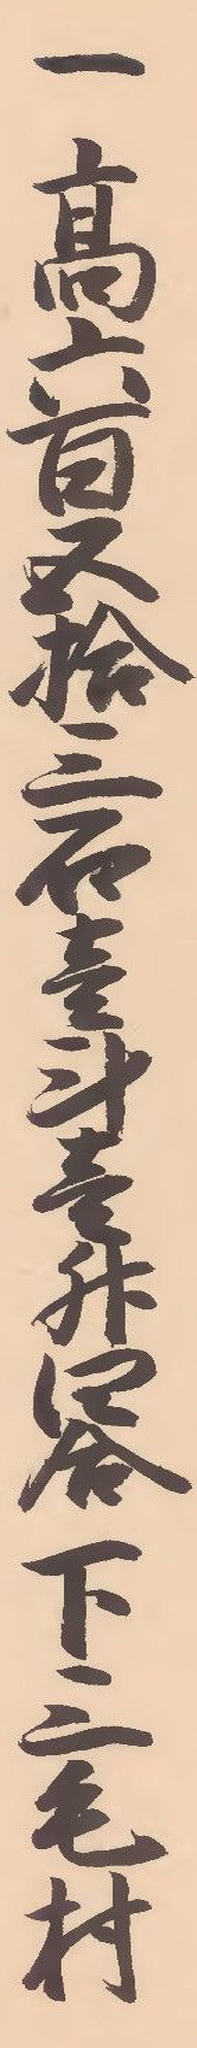一高六百五拾三石壱斗壱升四合下三毛村
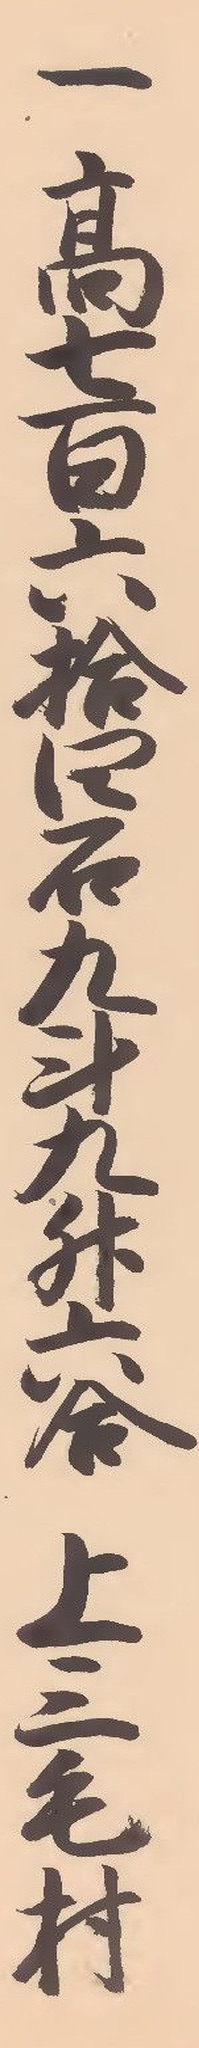一高七百六拾四石九斗九升六合上三毛村
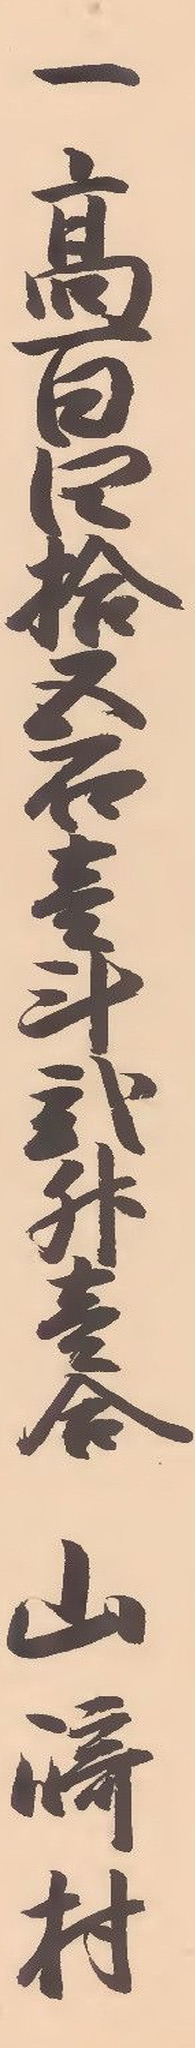一高百四拾五石壱斗弐升壱合山崎村
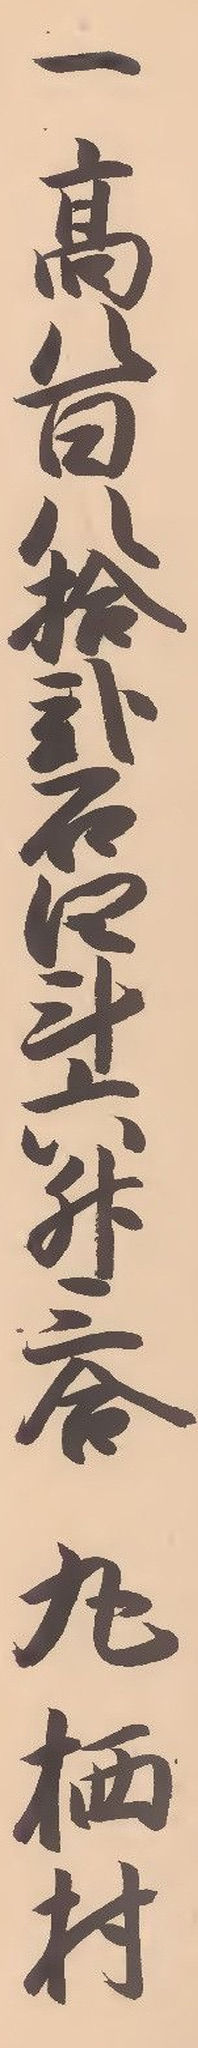一高八百八拾弐石四斗六升三合丸栖村
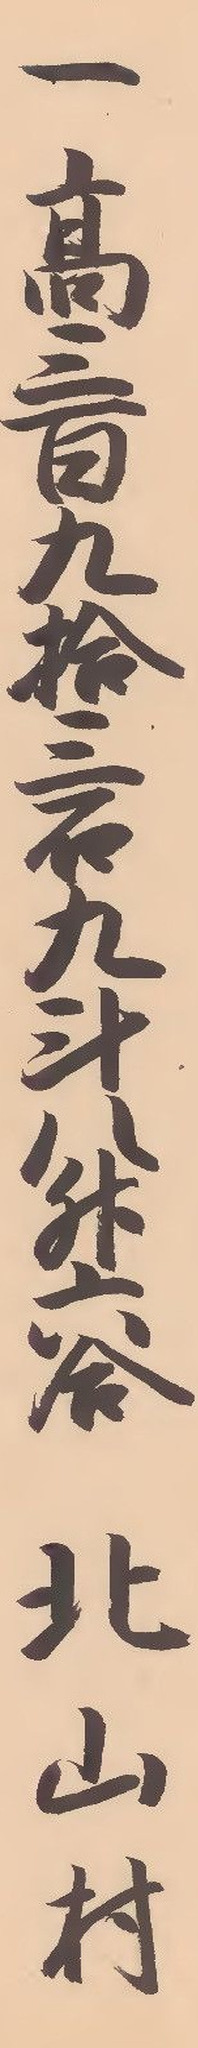一高三百九拾三石九斗八升六合北山村
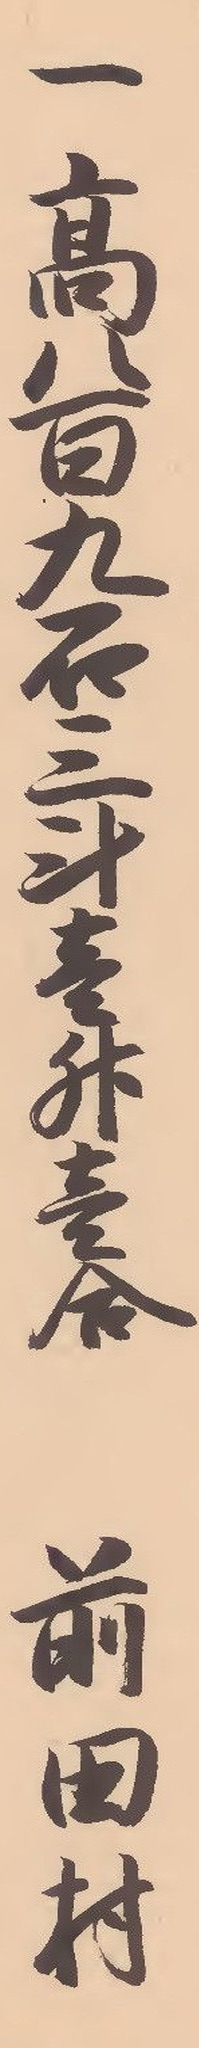一高八百九石三斗壱升壱合前田村
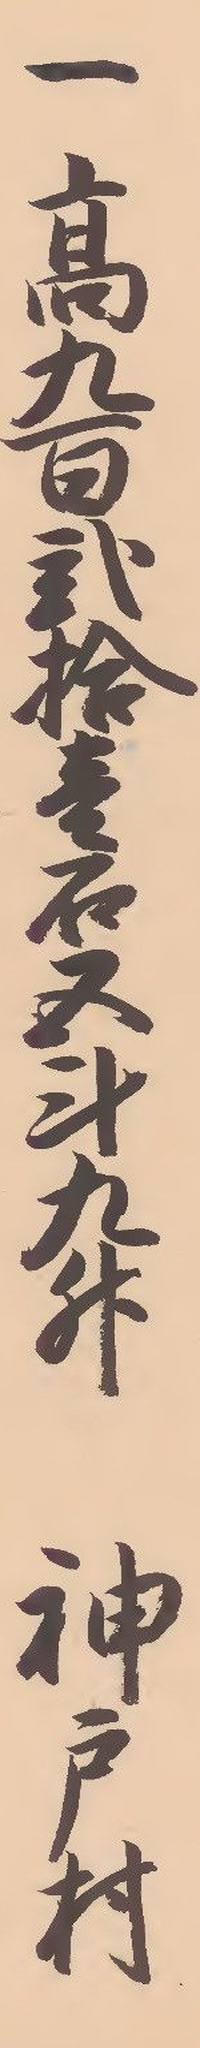一高九百弐拾壱石五斗九升神戸村

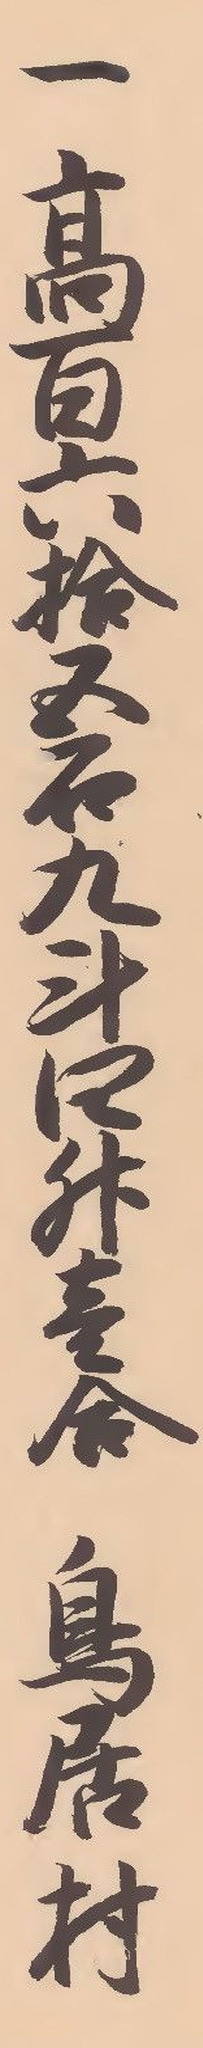一高百六拾五石九斗四升壱合鳥居村
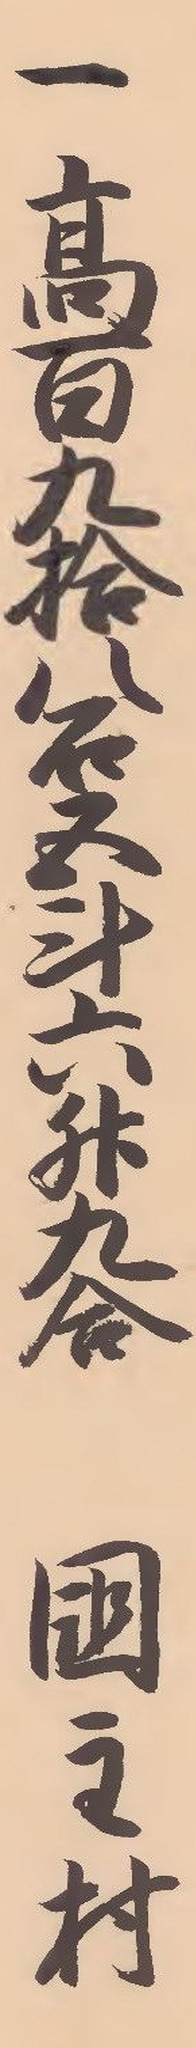一高百九拾八石五斗六升九合国主村
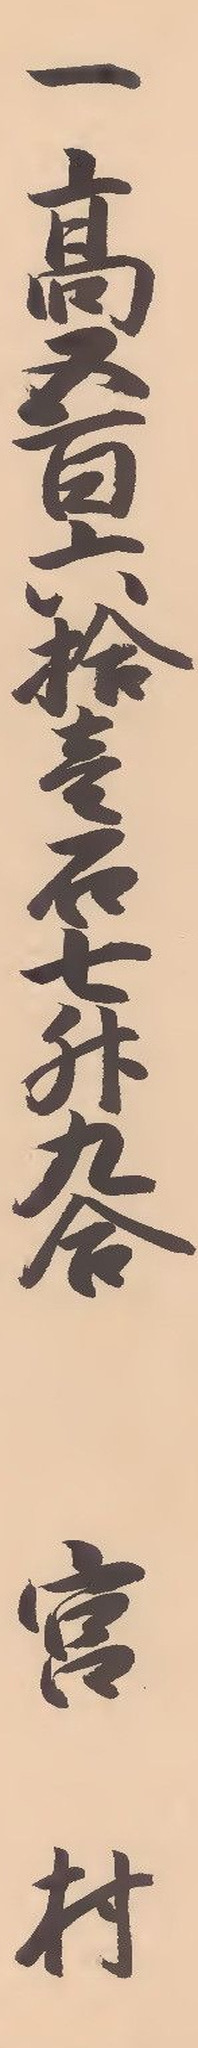一高五百六拾壱石七升九合宮村
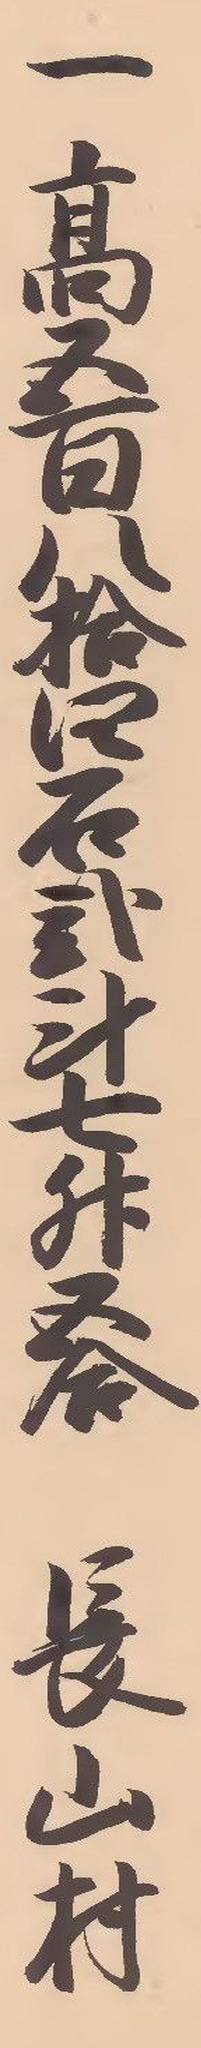一高五百八拾四石弐斗七升五合長山村
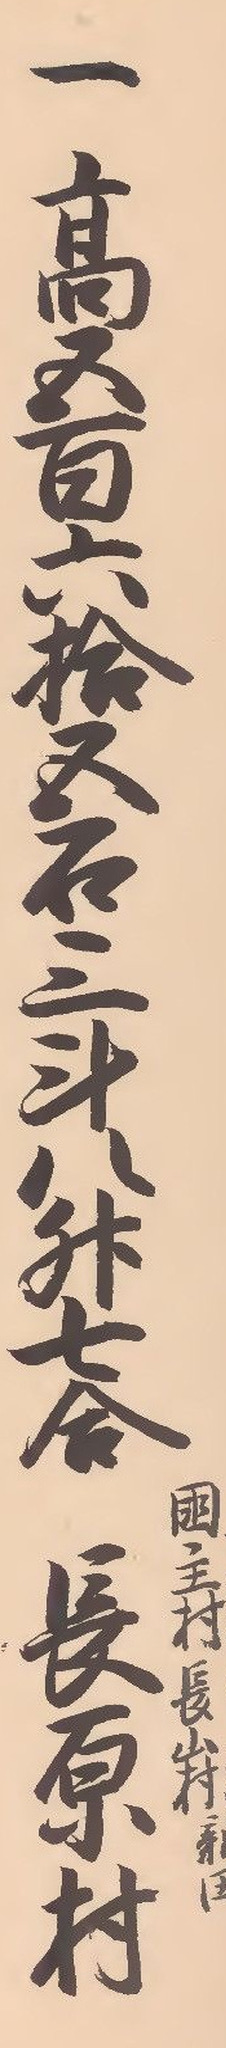一高弐百弐拾五石三斗八升弐合上野山村
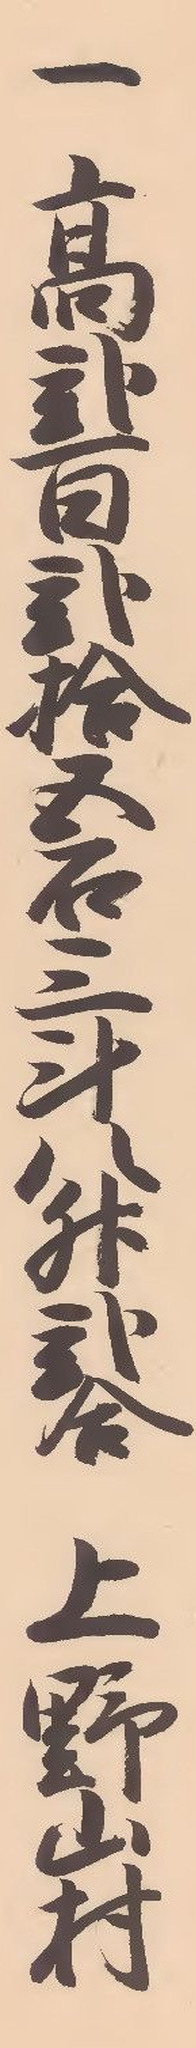一高弐百弐拾五石三斗八升弐合上野山村
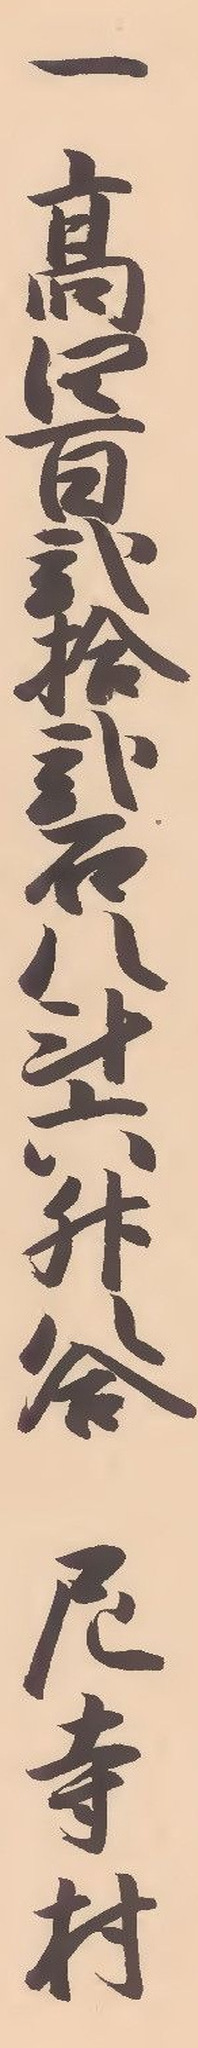一高四百弐拾弐石八斗六升八合尼寺村
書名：紀伊国郷帳
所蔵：国立公文書館 National Archives of Japan
